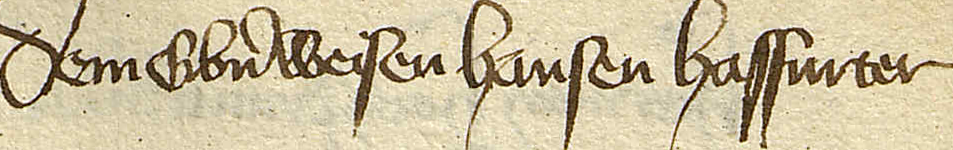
dem Ebn* weiſen hanſen haſfurter
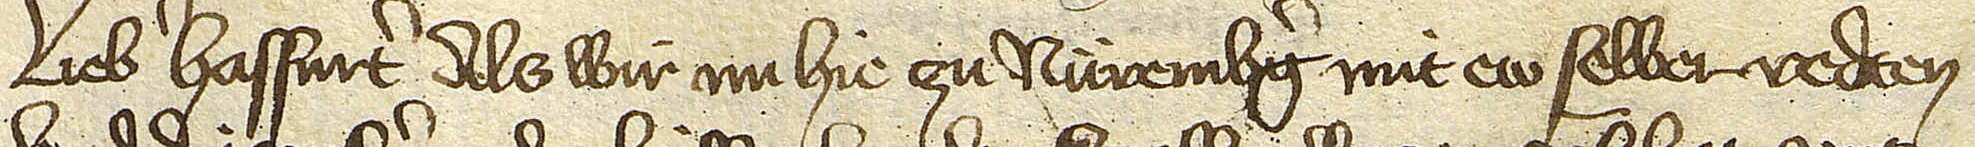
Lieb* haſfurt* Als wir nu hie cʒu Nüremb*g mit ew ſelber redten
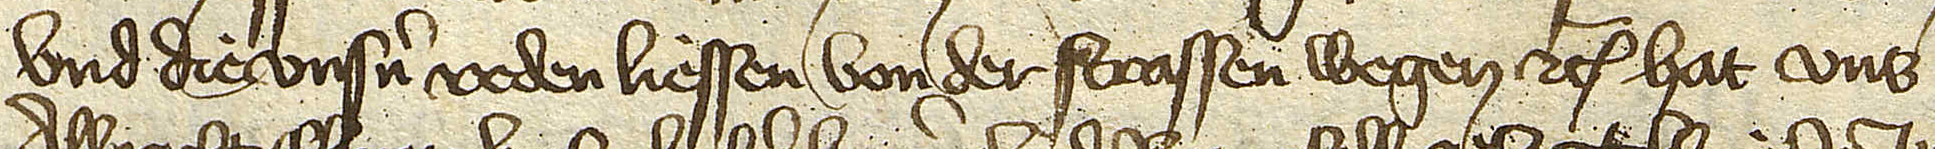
vnd die vnſn* reden lieſſen von der ſtraſſen wegen ec* hat vns
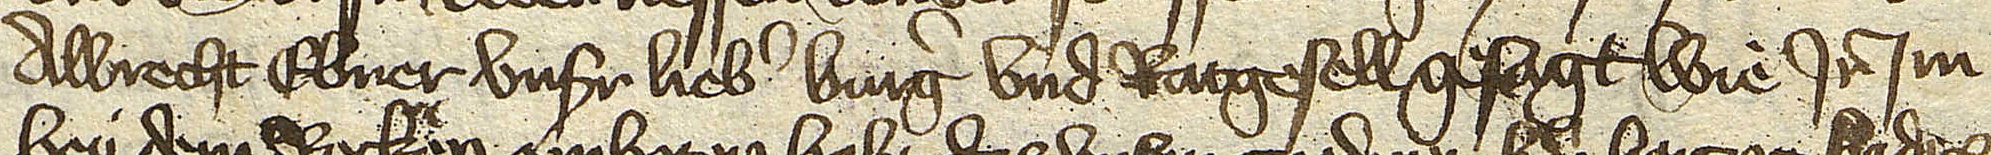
Albrecht Ebner vnſ*r lieb* burg* vnd Ratgeſell geſagt wie Ir Im
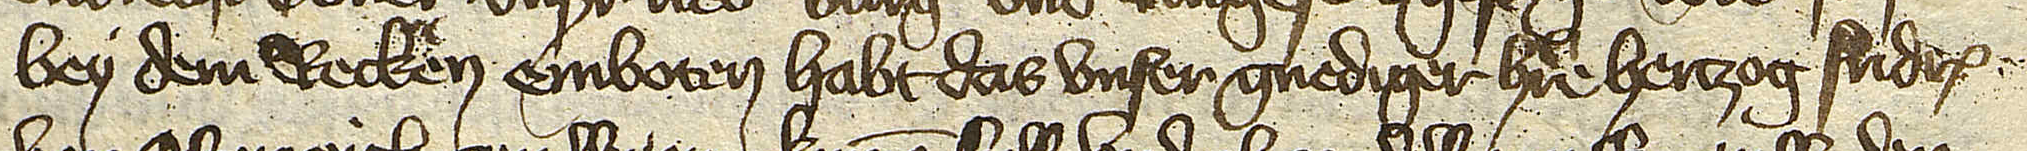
bey dem Recken emboten habt das vnſer gnediger h*re hercʒog fridr*
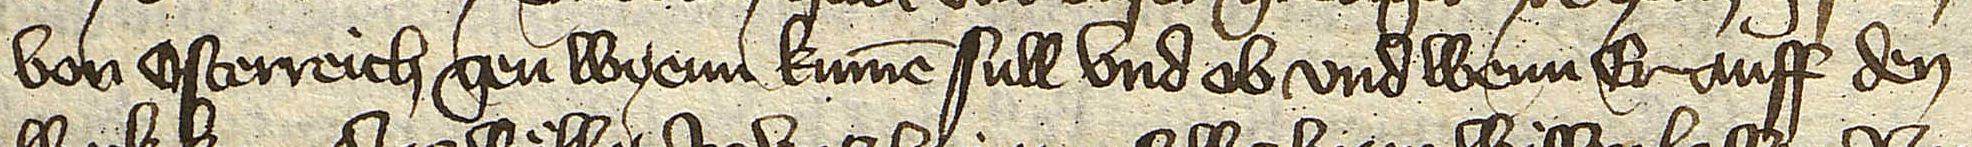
von Oſterreich gen wyenn kume* ſull vnd ob vnd wenn Er auff den
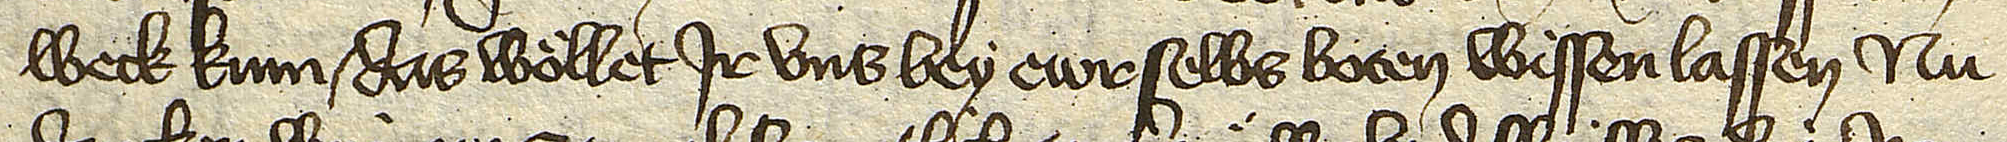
weck kum / das wöllet Ir vns bey ewr ſelbs boten wiſſen laſſen Nu
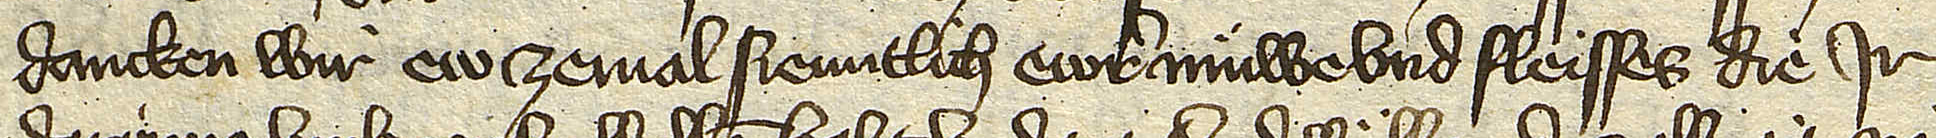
dancken wir ew cʒemal freuntlich ewr* müwe vnd fleiſſes die Ir
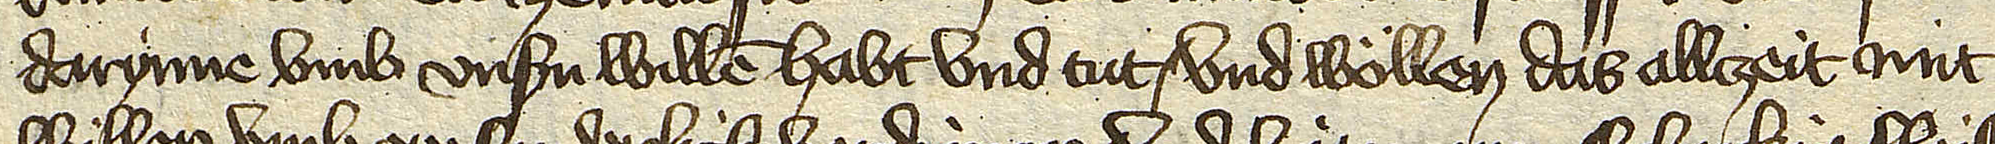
darynne vmb vnſ*n wille* habt vnd tut / vnd wöllen das allcʒeit mit
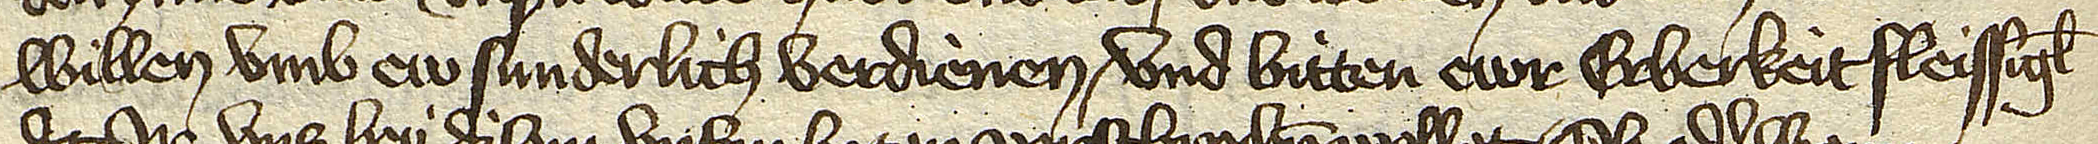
willen vmb ew ſunderlich verdienen / vnd bitten ewr Erberkeit fleiſſigl*
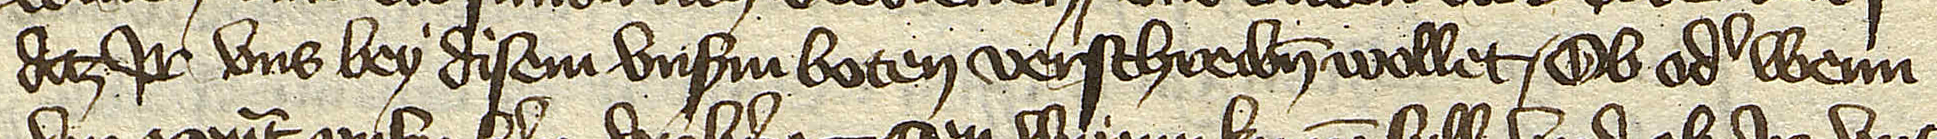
daʒ Ir vns bey diſem vnſ*m boten verſchreibn* wollet / Ob od* wenn
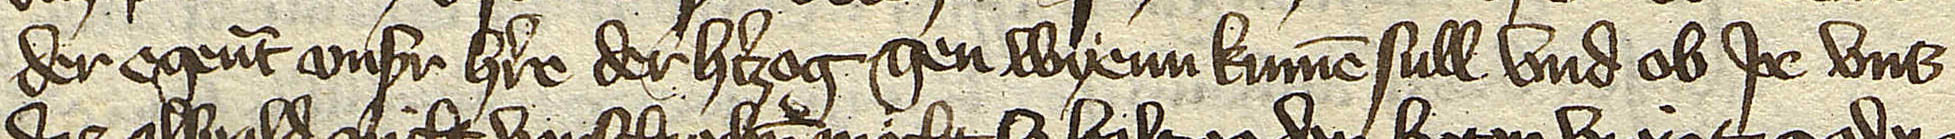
der egent* vnſ*r h*re der h*cʒog gen wyenn kume* ſull vnd ob Ir vns
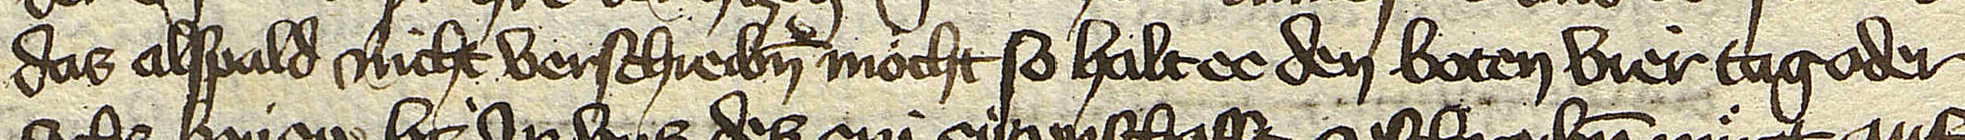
das alſpald nicht verſchreibn* möcht ſo halt ee den boten vier tag oder
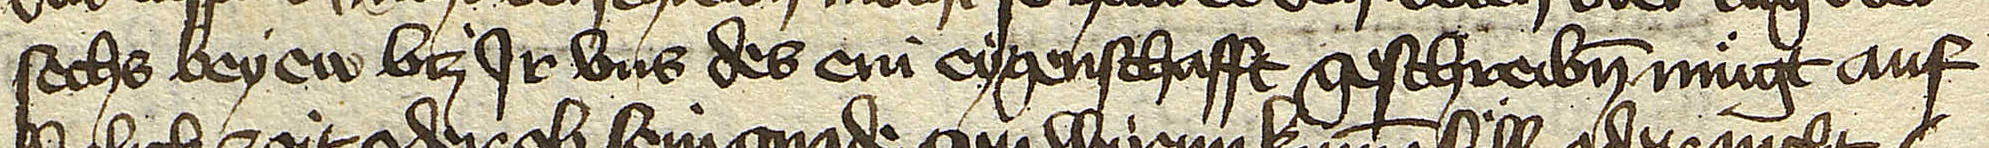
ſechs bey ew biʒ Ir vns des ein eygenſchafft geſchreibn* mügt auf
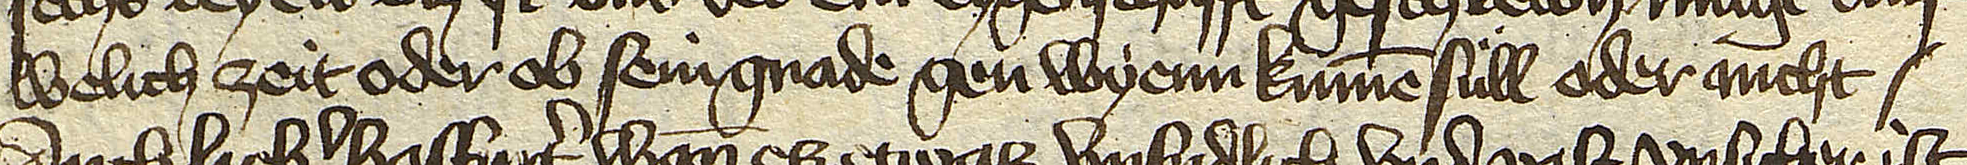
welich cʒeit oder ob ſein gnade gen wyenn kume* ſüll oder nicht /
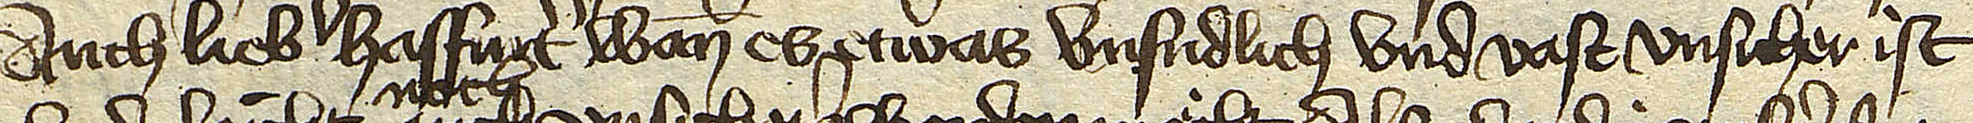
Auch lieb* haſfurt* wan* es etwas vnfridlich vnd vaſt vnſicher iſt
